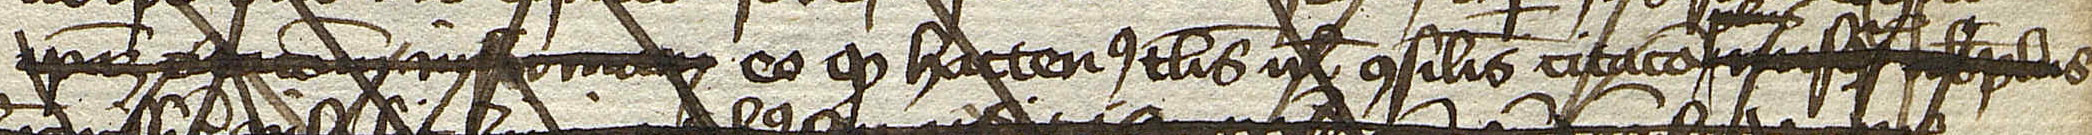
ipa* %%% infirmam eo q* hacten *tlis ul* *ſilis citaco* %%%% ul* plus
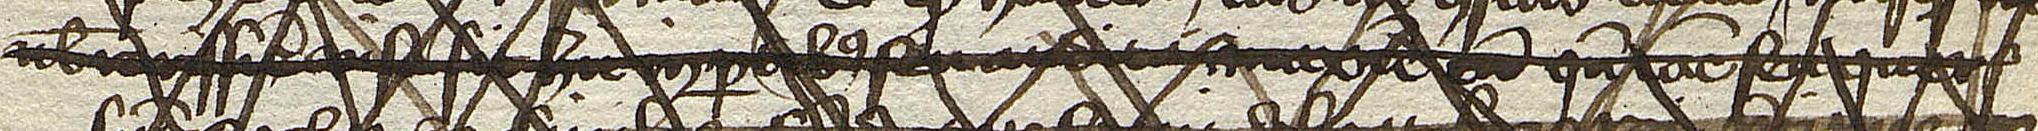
ul* %%%%%% niſi ſic hic in%%%* ſe%%% di%%%% %%%%% %% qu%%* ſeu quer*
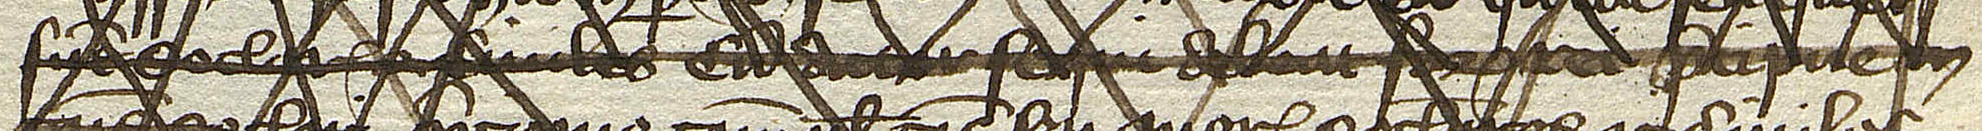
ſ%%* Soc%%* %%%%%%* Eu* Ac%%% ſequi deleat %%* rei pci*pue in
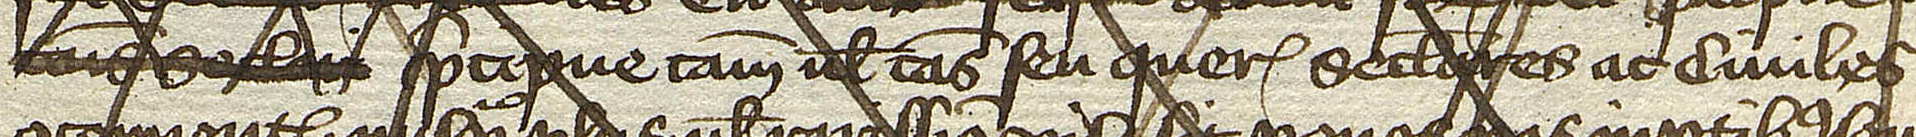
caus* Se%%% pcipue tam* ul* tas* ſeu quer* Seclares ac Ciuiles
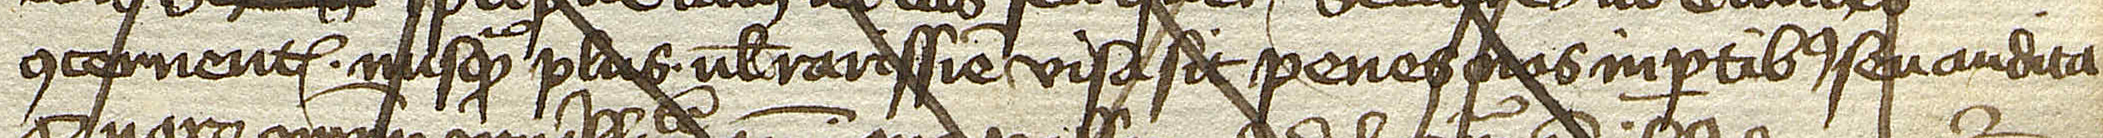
*cernent* . nuſq* plus . ul* rariſſie* viſa ſit penes nos in ptib* ſeu audita
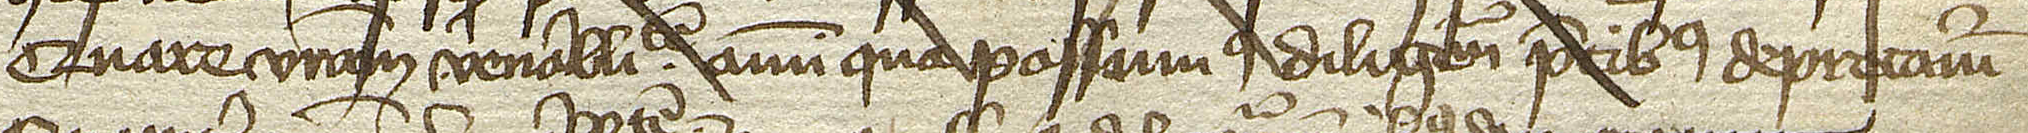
Quare vram* venabli* . ami* qua poſſum *diligen* p*tib* deprecam*
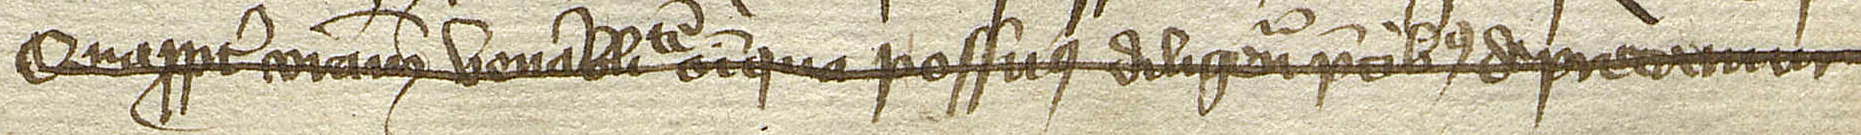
Quappt* vram* venabli* %%%%% poſſu* diligen* pcib* deprecatuur*
